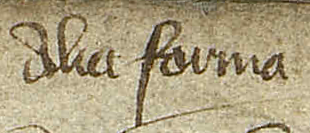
Alia forma
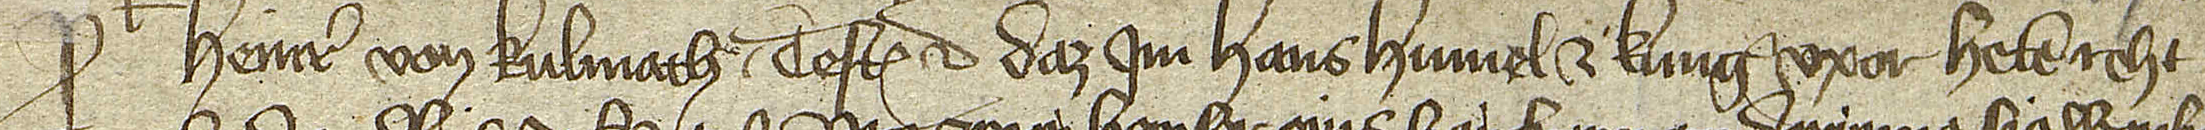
P* heinr* von Kulmach / Teſt* ec* daʒ Im hans humel @ kung* vxa hete* reht
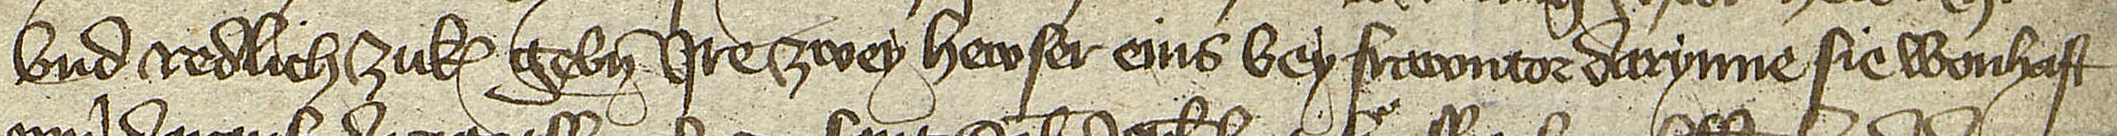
vnd redlich cʒuk* gebn* Ire cʒwey hewſer eins bey frawntor darynne ſie wonhaft
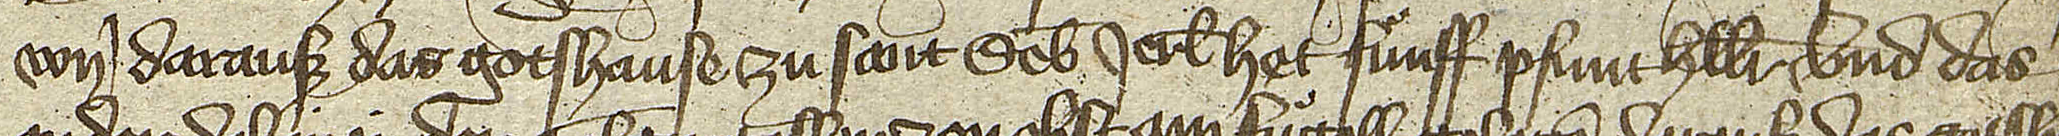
wn* darauſʒ das gotſhauſe cʒu ſant Seb* Ierl* het fünff pfunt hllr* / vnd das
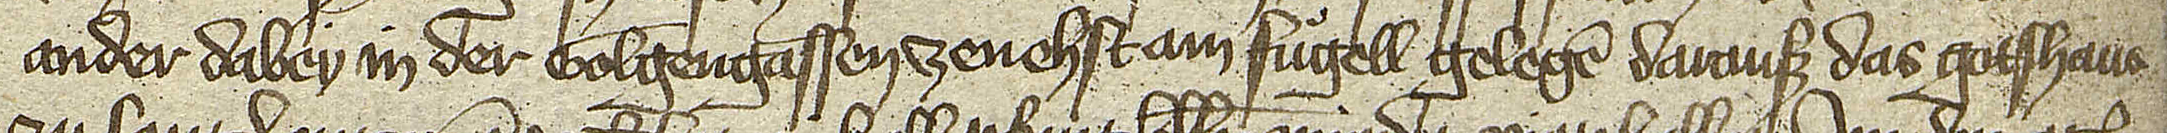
ander dabey in der Golgengaſſen cʒenehſt am fügell gelege* darauſʒ das gotſhaus
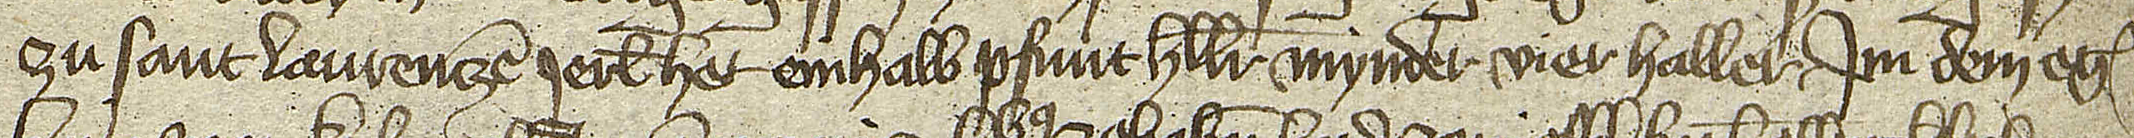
cʒu ſant laurencʒe* Ierl* het einhalb pfunt hllr* mynder vier haller / Im dem eg*
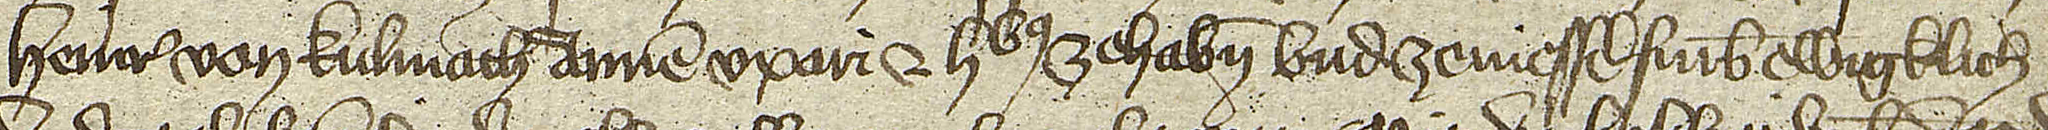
heinr* von kumnach Anne* vxari @ h* cʒehabn* vnd cʒenieſſe* fürb* ewigklich
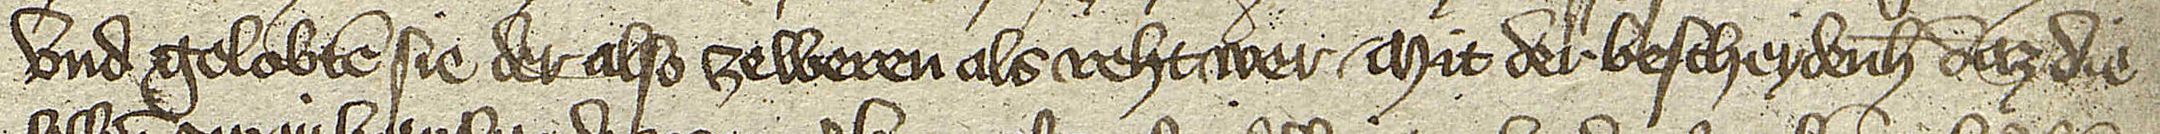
vnd gelobte* ſie der alſo cʒeweren als reht wer / Mit der beſcheydenh* daʒ die
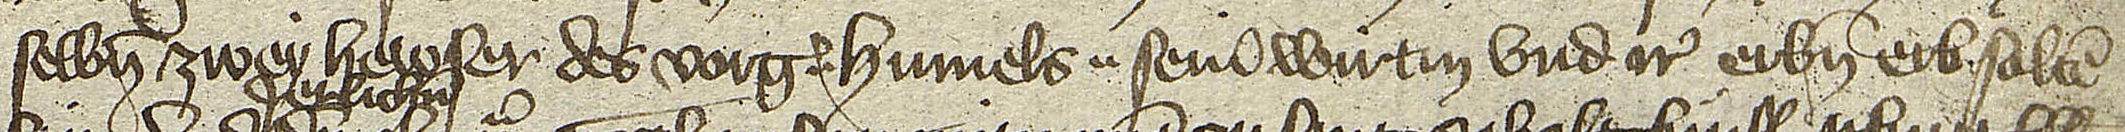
ſelbn* cʒwey hewſer des vorg* ~ humels ~ ſein* wirtin vnd ir* erbn* erb ſolte*
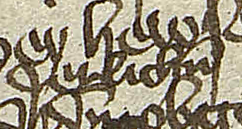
Ierlichn*
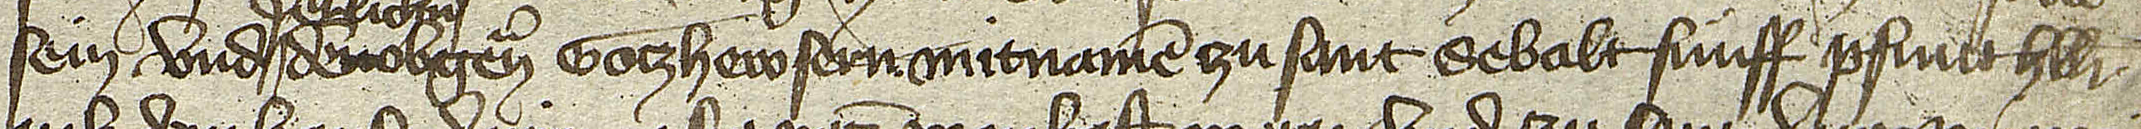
ſein / vnd de* obgen* Gocʒhewſern mitname* cʒu ſant Sebolt fünff pfunt hllr*
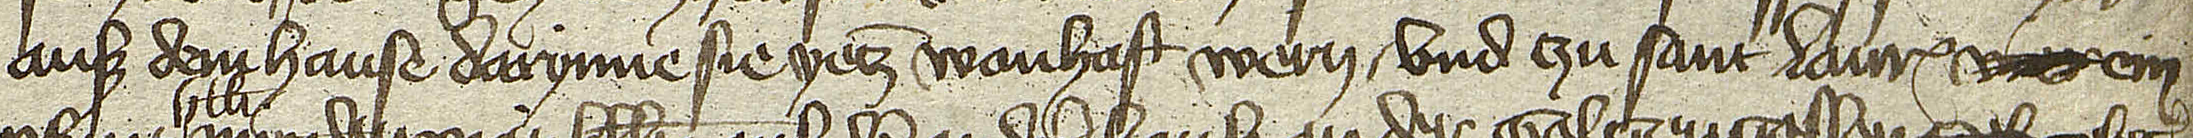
auſʒ dem hauſe darynne ſie yecʒ* wonhaft wern / vnd cʒu ſant laur* vier ein
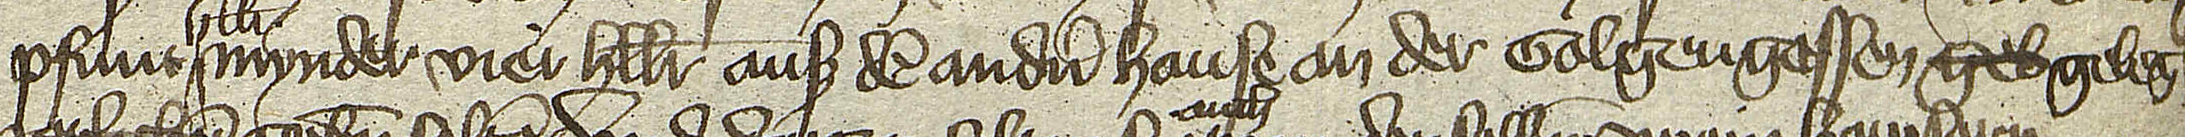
pfunt mynder vier hllr* auſʒ de* andn* hauſe an der Golgengaſſen geb geleg*
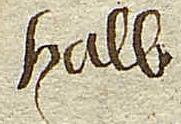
halb
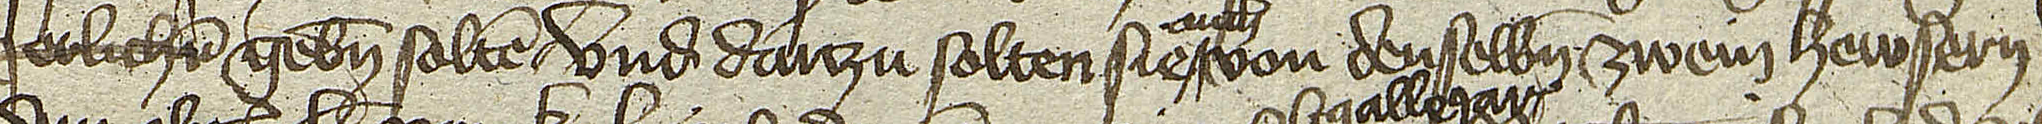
Ierlichn* gebn* ſolte* / vnd darcʒu ſolten ſie von denſelbn* cʒwein hewſern
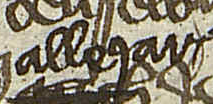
alle Iar
